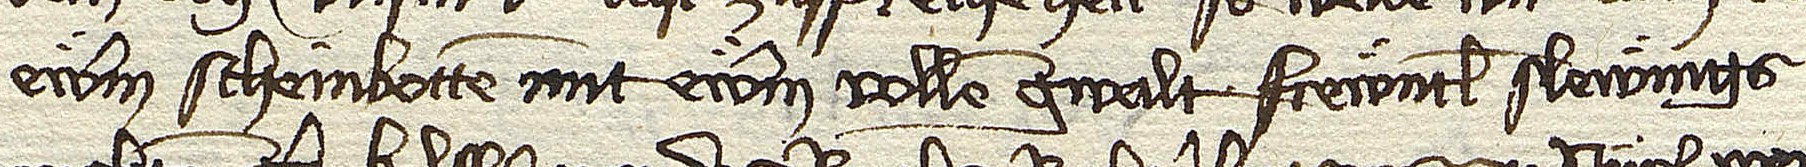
ew*n ſcheinbotte* mit ew*m volle* gwalt . frewntl* ſlewnigs
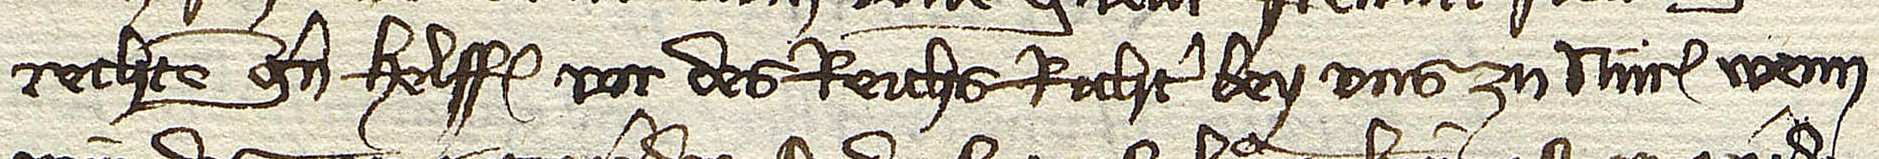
rechte* g*n helff* vor des Reichs Richt* bey vns ʒu Nür* wenn
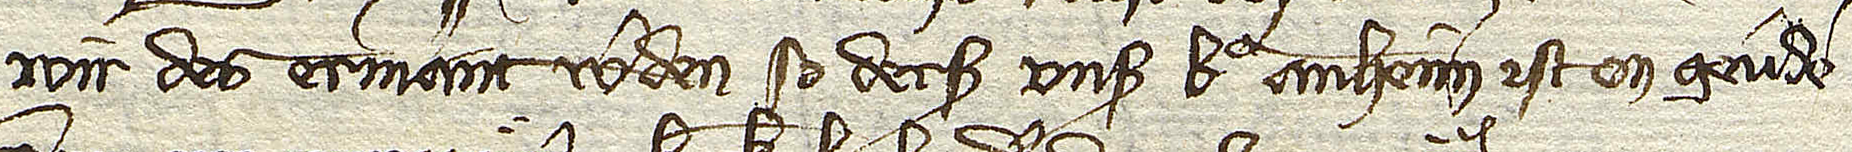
wir des ermant w*den ſo derſ* vnſ* b* anheim iſt on geu*de
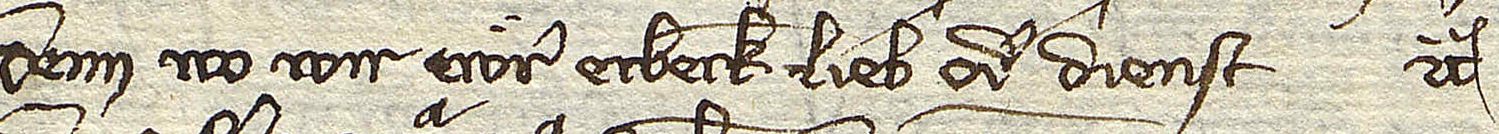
Denn wo wir ew*r erberk* lieb od* dienſt ec*
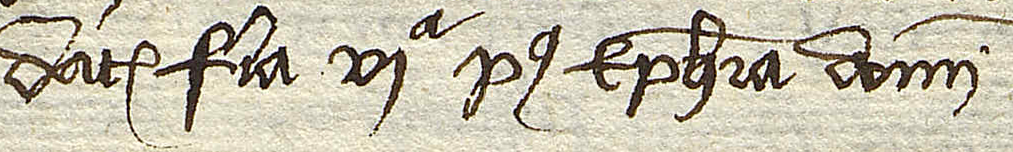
Dat* fia* vi* p* Ephia* domi*
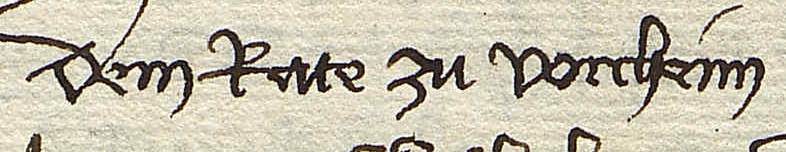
Dem Rate ʒ Vortheim
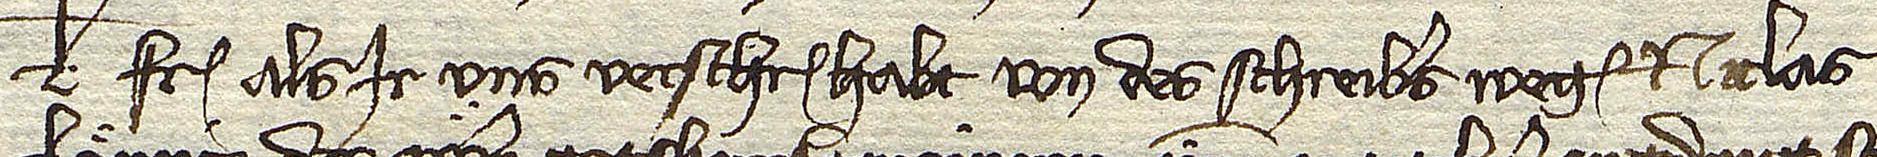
L* fr* als Ir vns verſchr* habt von des ſchreib*s weg* Niclas
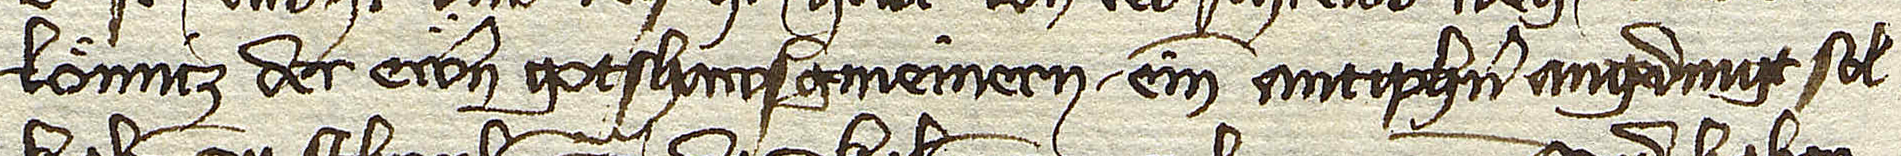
Lönniʒ der ew*n gotſhawſgmeinern / ein* antiphn* angedingt ſol
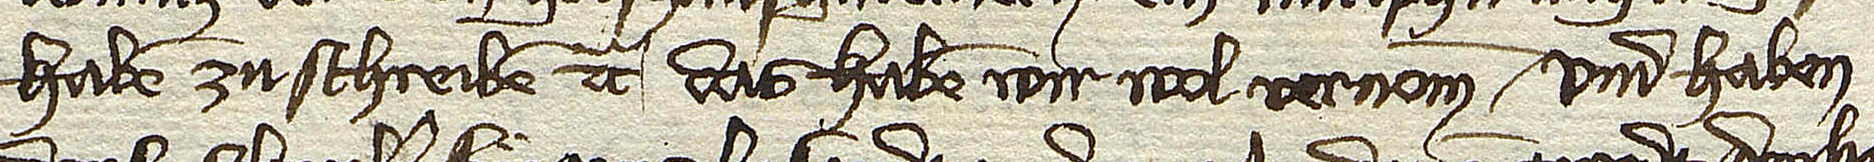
habe* ʒu ſchreibe* ec* / das habe* wir wol vernom* / vnd haben
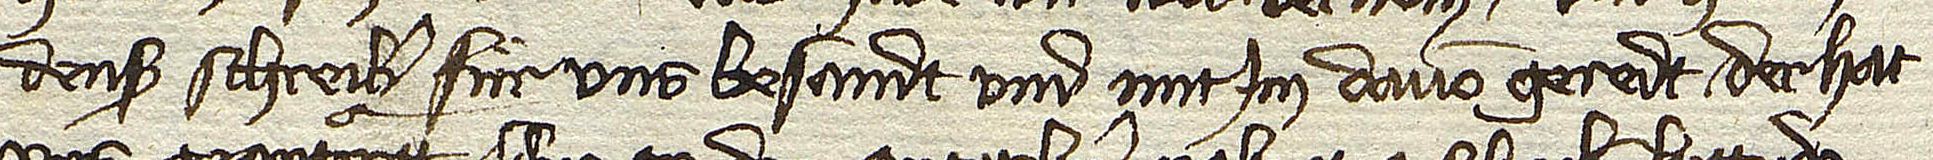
denſ* ſchreib* für vns beſandt vnd mit Im dauo* geredt / der hat
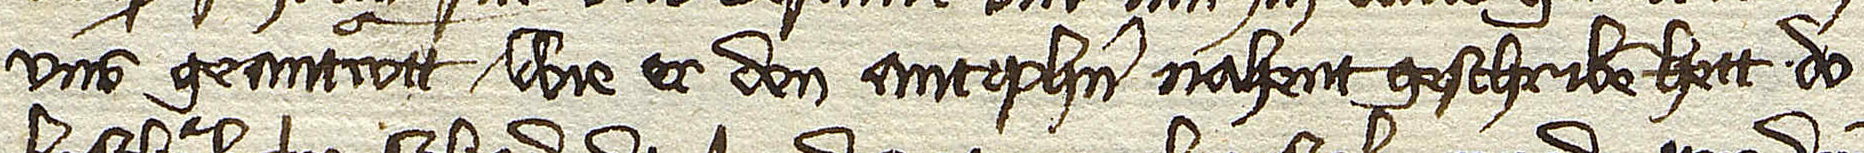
vns geantw*tt / wie er den antiph*n nahent geſchribe* hett . do
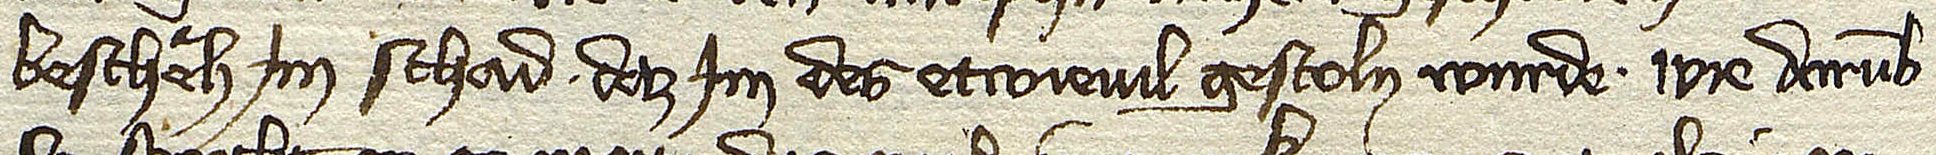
beſchëh Im ſchad . daʒIm des etwieuil geſtoln wurde . wie daru*b
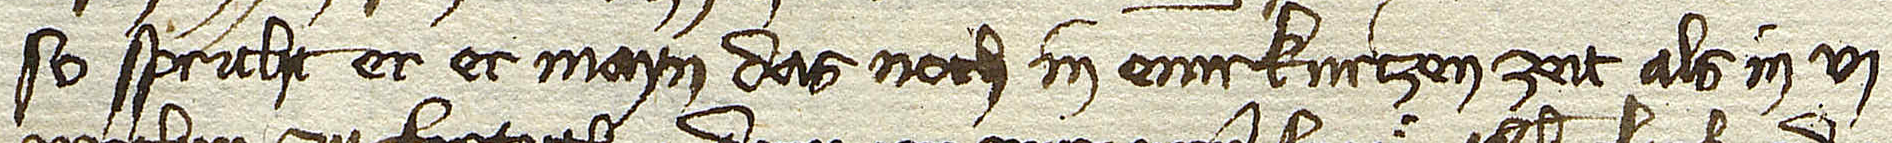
ſo ſpricht er er mayn das noch in einr kurcʒen ʒeit als in vi
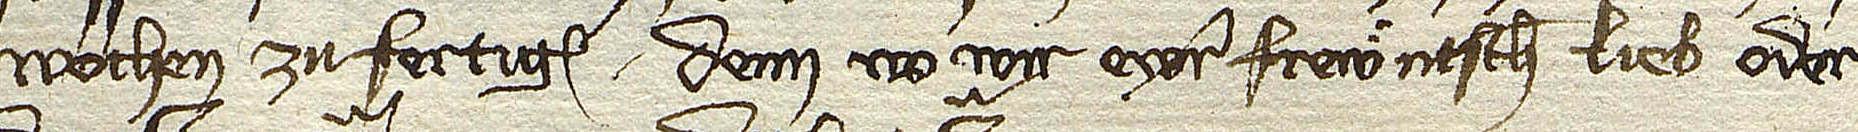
wochen ʒu fertig* / Denn wo wir ew*r frewntſch* lieb oder
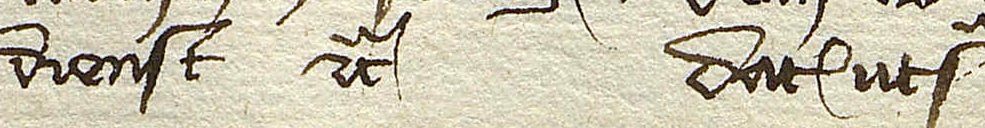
dienſt ec* Dat* ut ſ*
